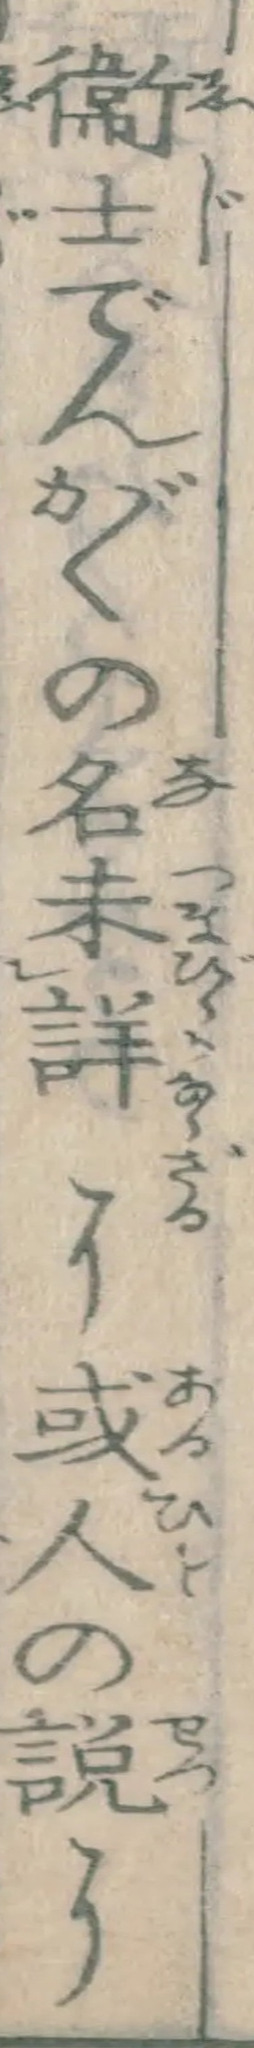衛士でんがくの名未詳に或人の説に
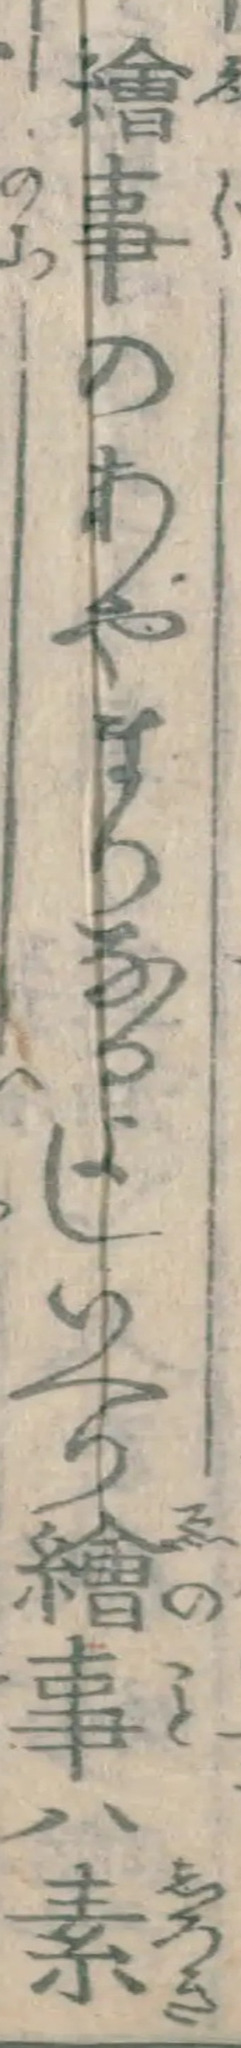絵事のあやまりなるよしいへり絵事は素
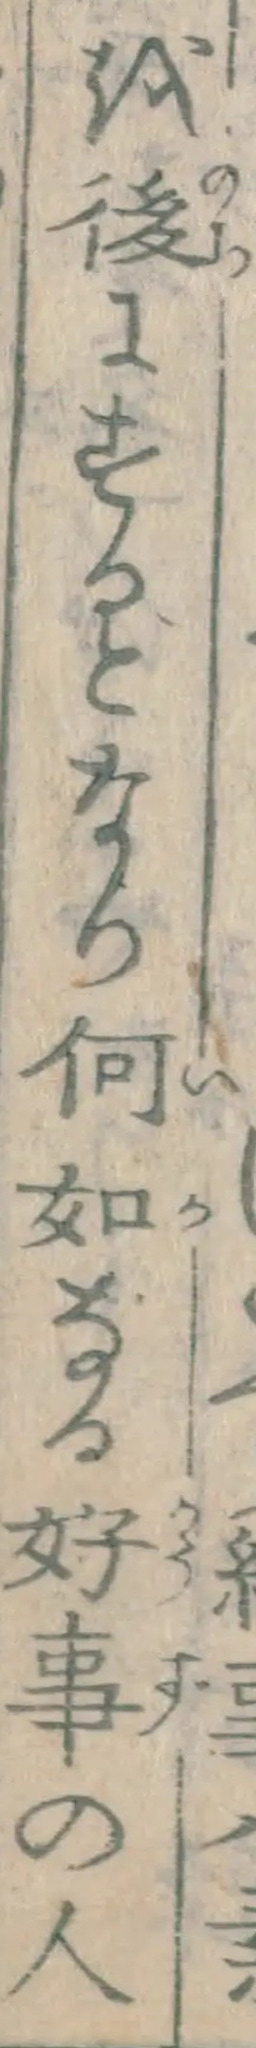を後にするとなり何如なる好事の人

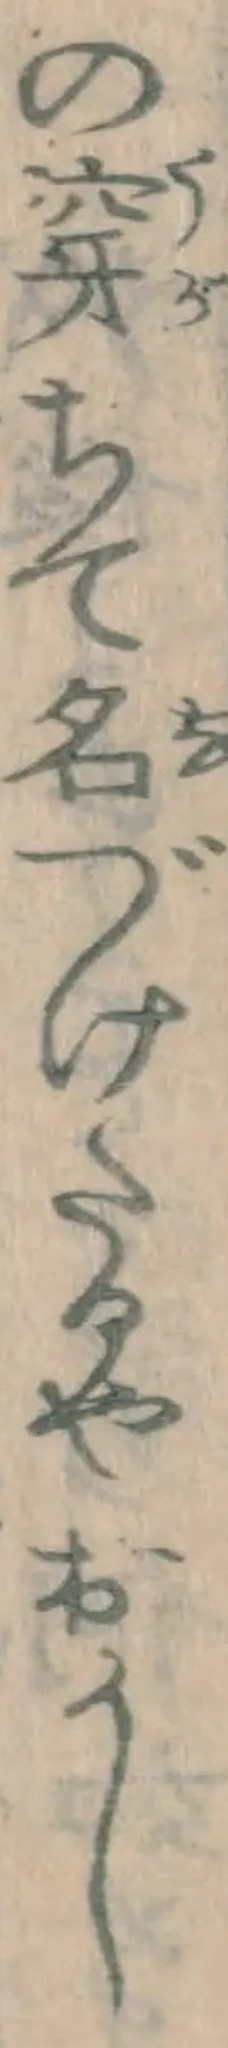の穿ちて名づけたるやおかし
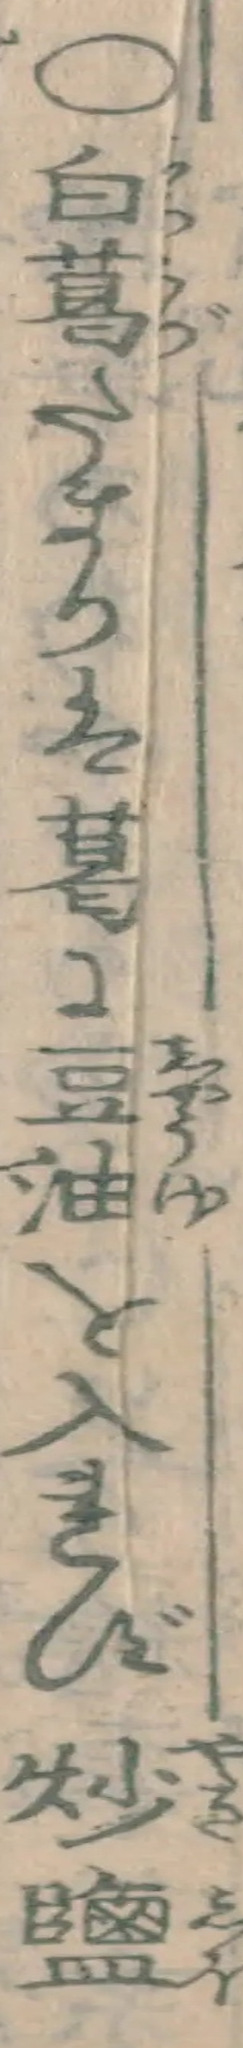○白葛たまりは葛に豆油を入れず炒塩
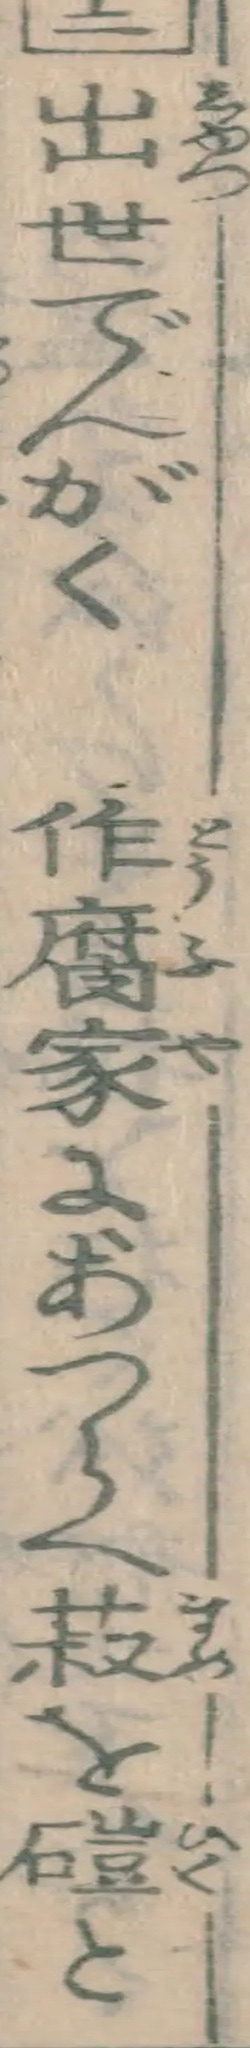九十二出世でんがく作腐家にあつらへ菽を磑と
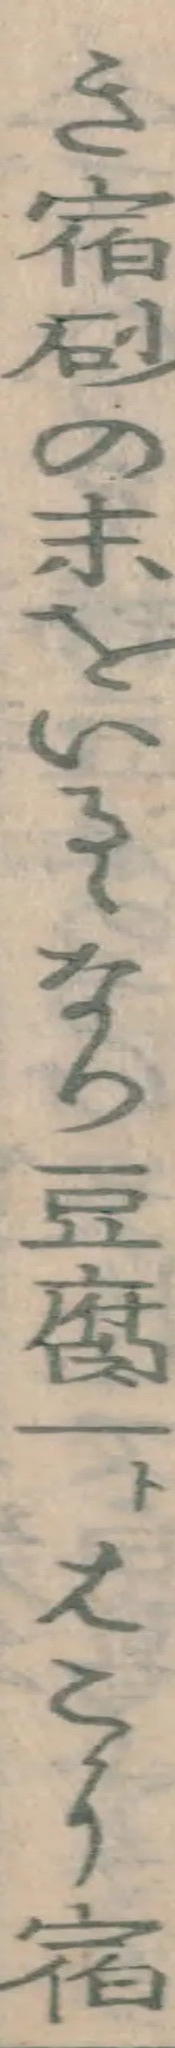き宿砂の末をいるゝなり豆腐一とはこに宿
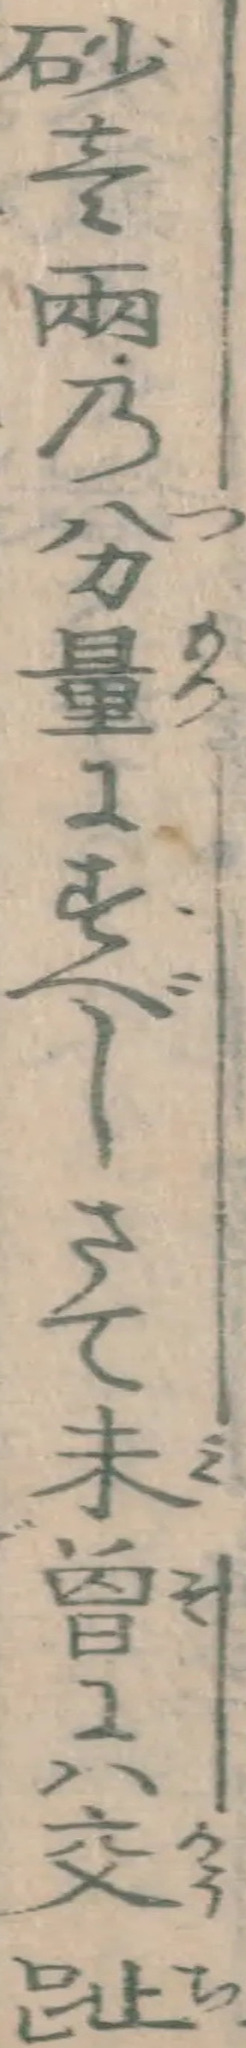砂壱両の分量にすべしさて未曽には交趾
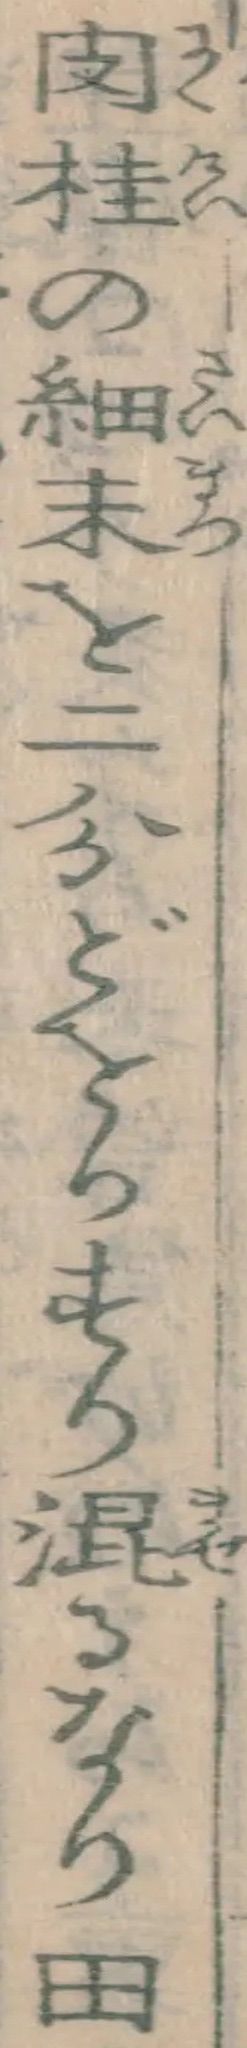肉桂の細末を二分どをりすり混るなり田
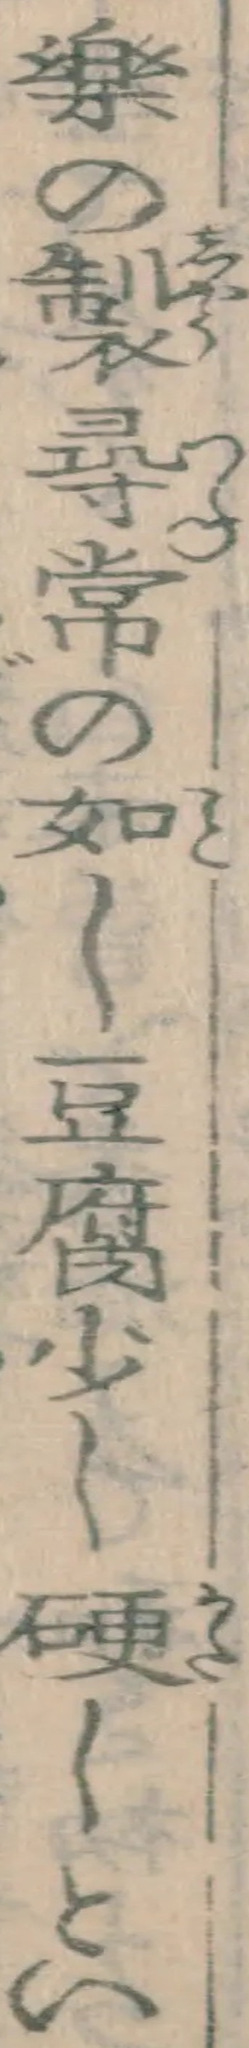楽の製尋常の如し豆腐少し硬しとい
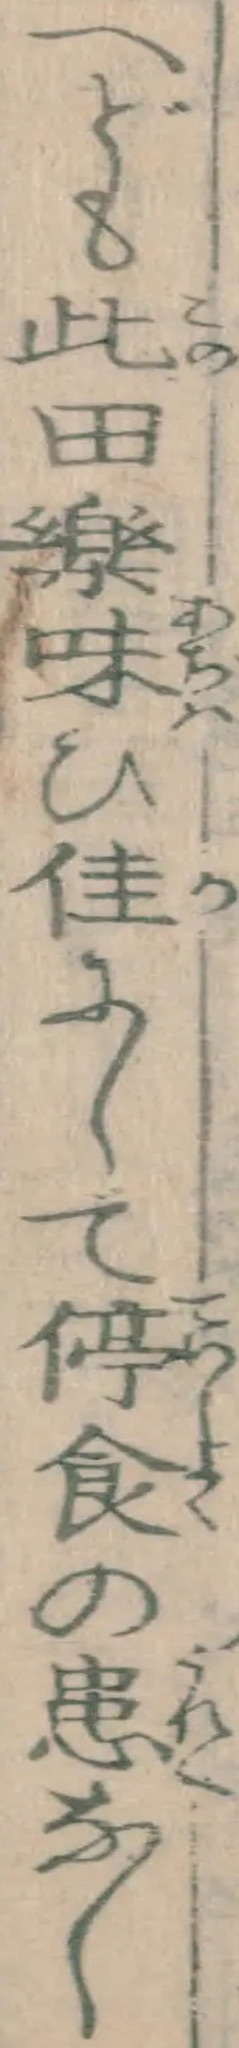へども此田楽味ひ佳にして停食の患なし
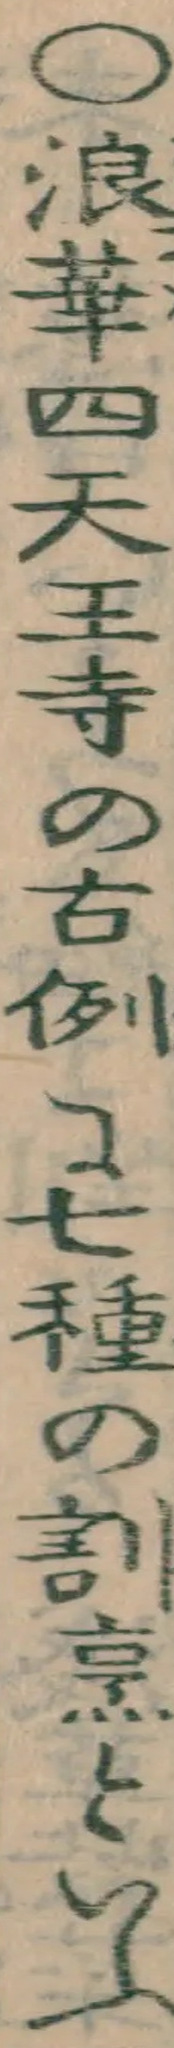○浪華四天王寺の古例に七種の割烹といふ
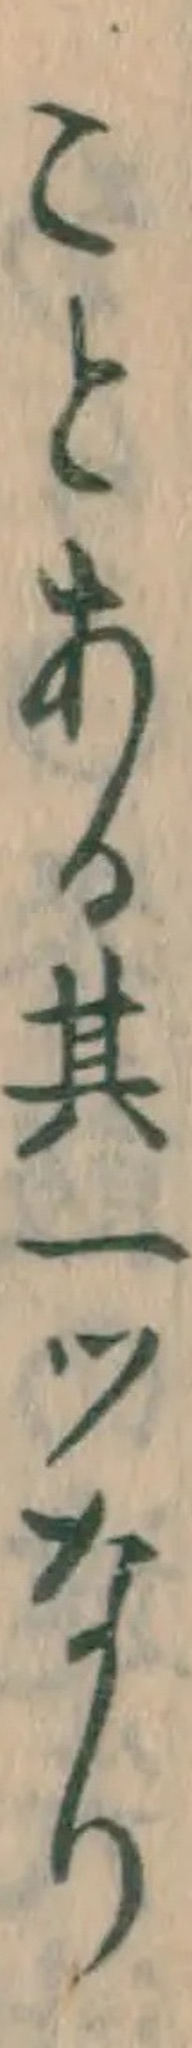ことある其一つなり
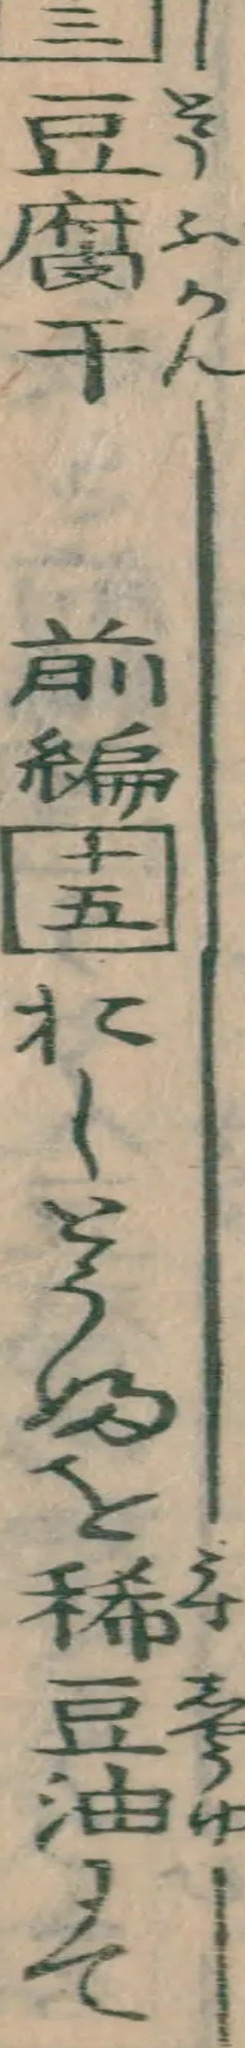九十三豆腐干前編十五おしとうふを稀豆油にて
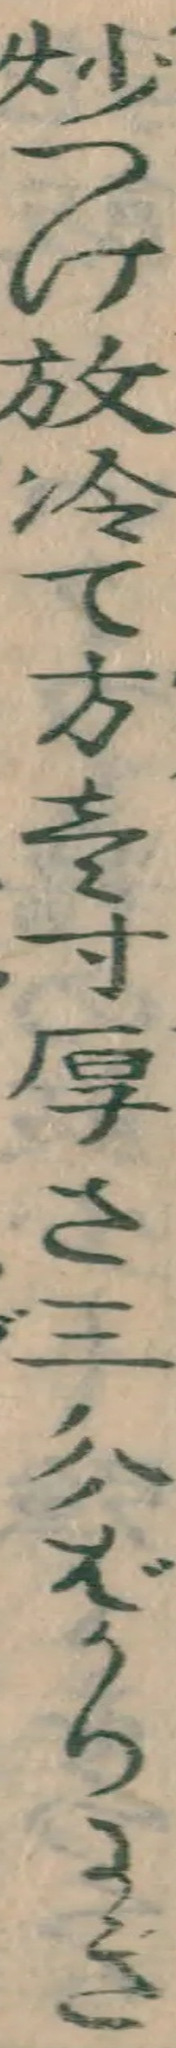炒つけ放冷て方壱寸厚さ三分ばかりにき
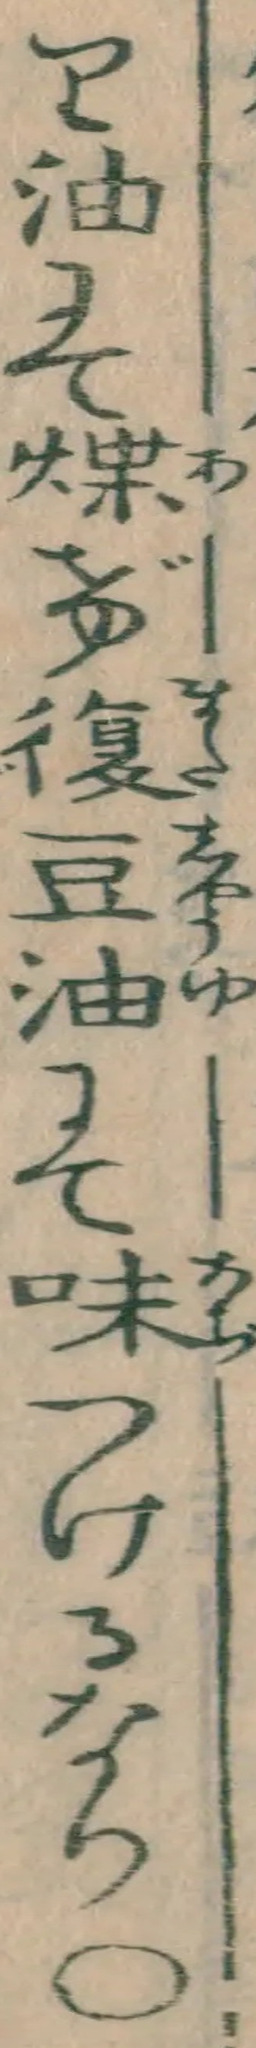り油にて煠げ復豆油にて味つけるなり○
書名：豆腐百珍. 続編
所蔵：国立国会図書館 National Diet Library, JAPAN
